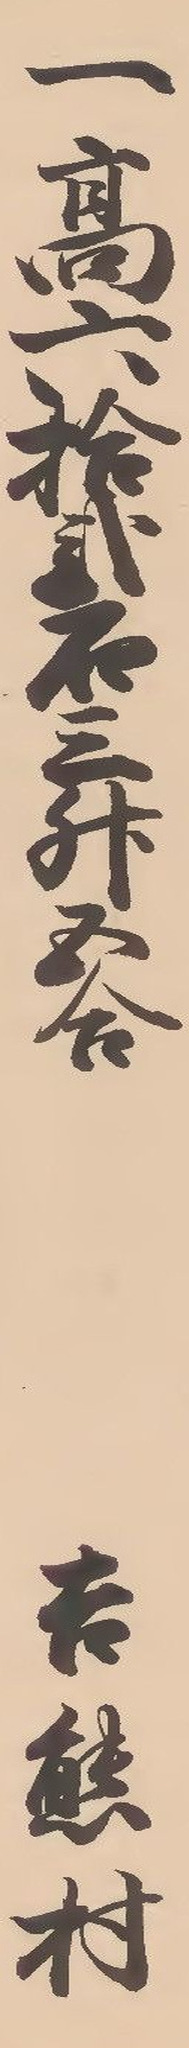一高六拾弐石三升五合吉熊村
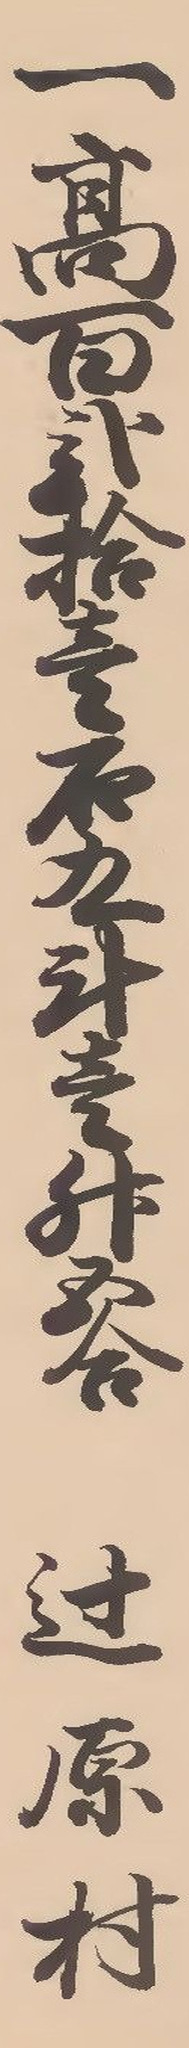一高百弐拾壱石九斗壱升五合辻原村
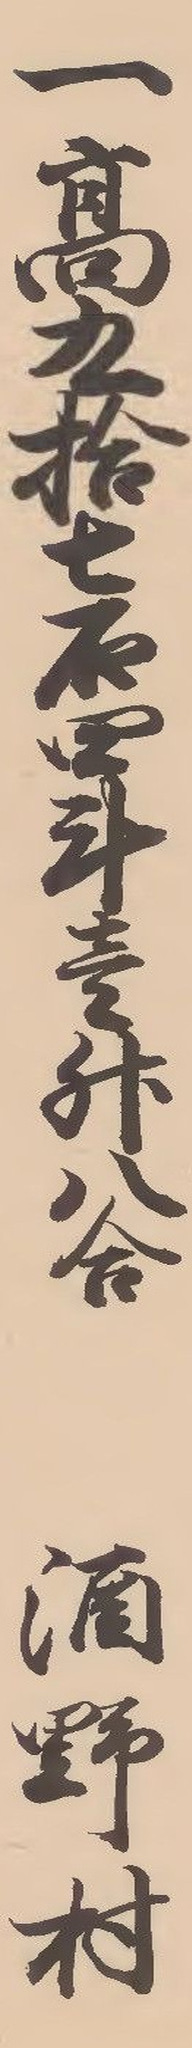一高九拾七石四斗壱升八合酒野村
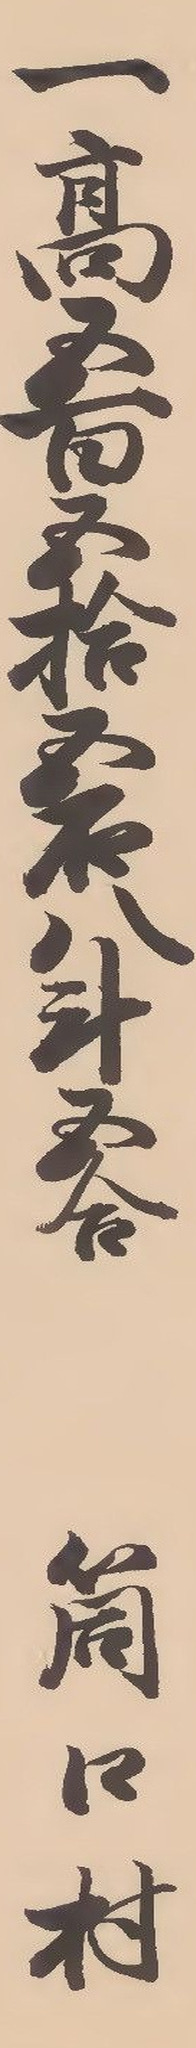一高五百五拾五石八斗五合筒口村
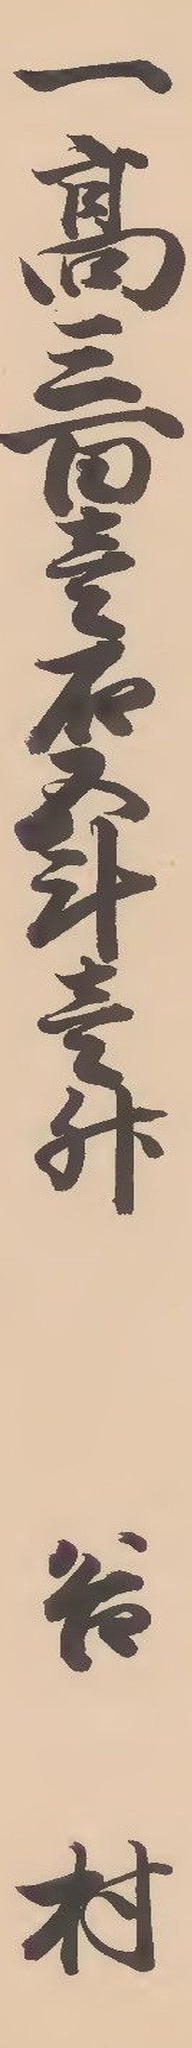一高三百壱石五斗壱升谷村

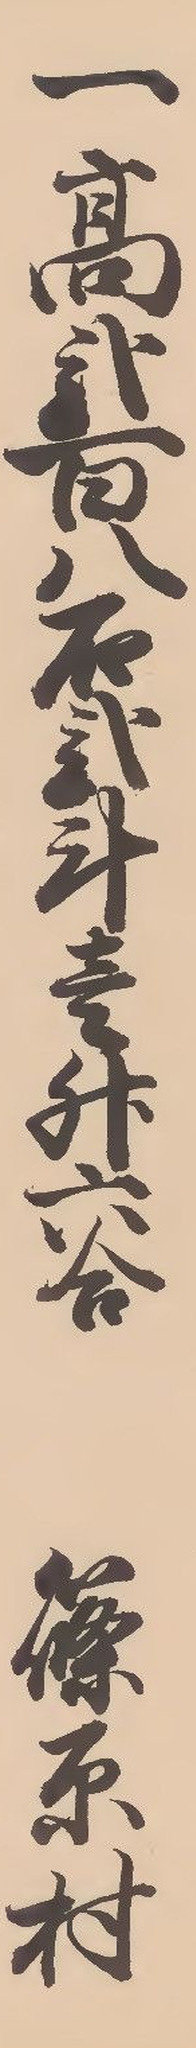一高弐百八石弐斗壱升六合篠原村
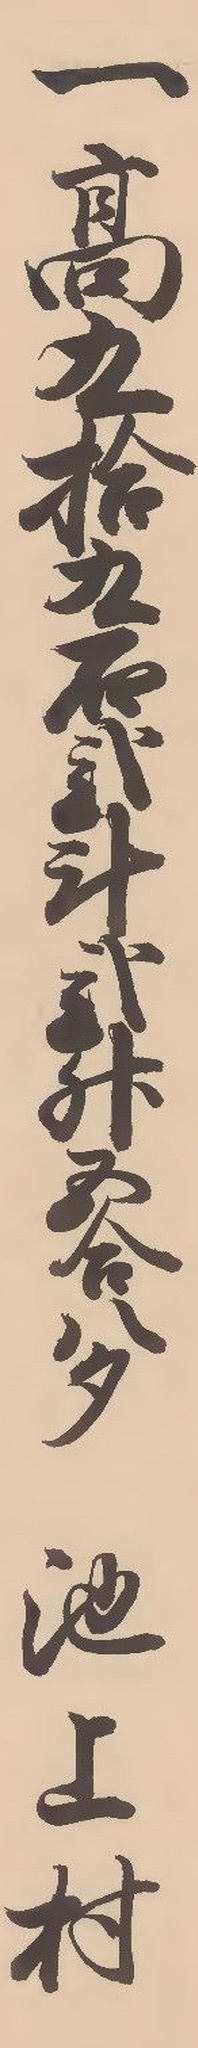一高九拾九石弐斗弐升五合八勺池上村
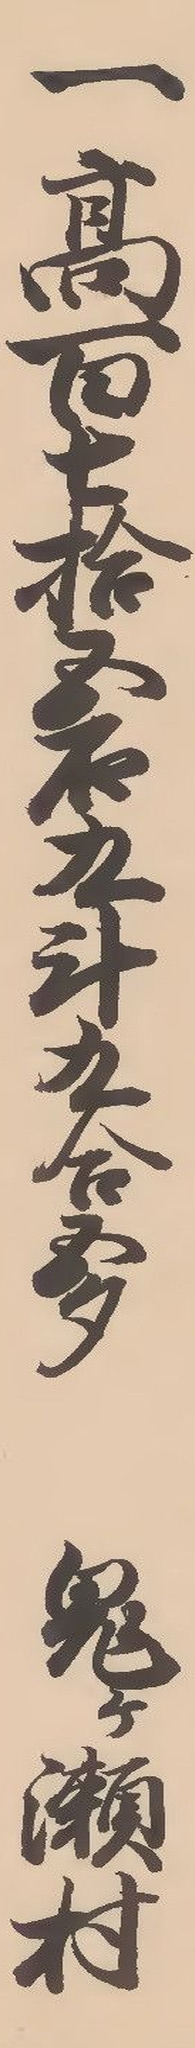一高百七拾五石九斗九合五勺鬼ヶ瀬村
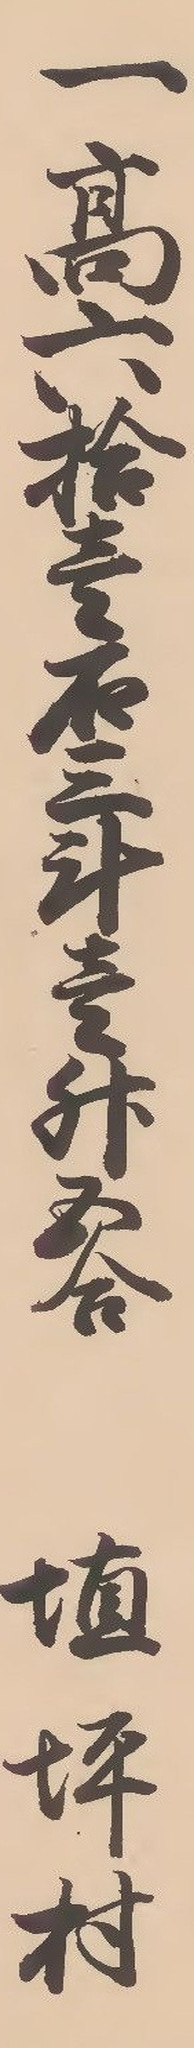一高六拾壱石三斗壱升五合埴坪村
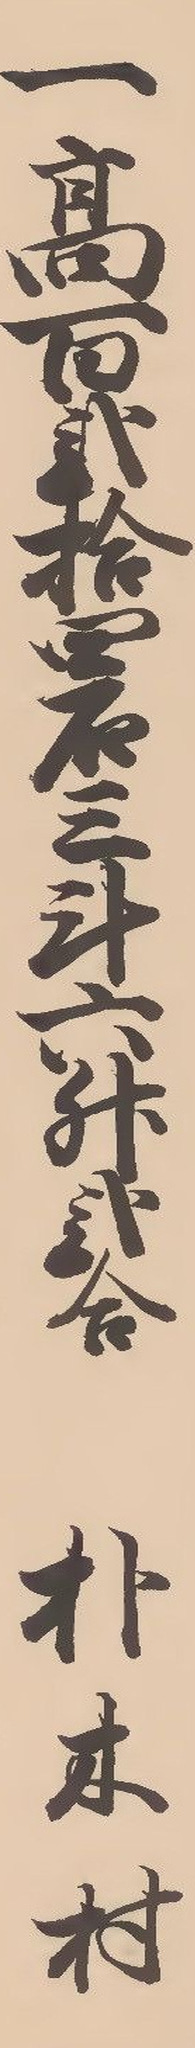一高百弐拾四石三斗六升弐合朴木村
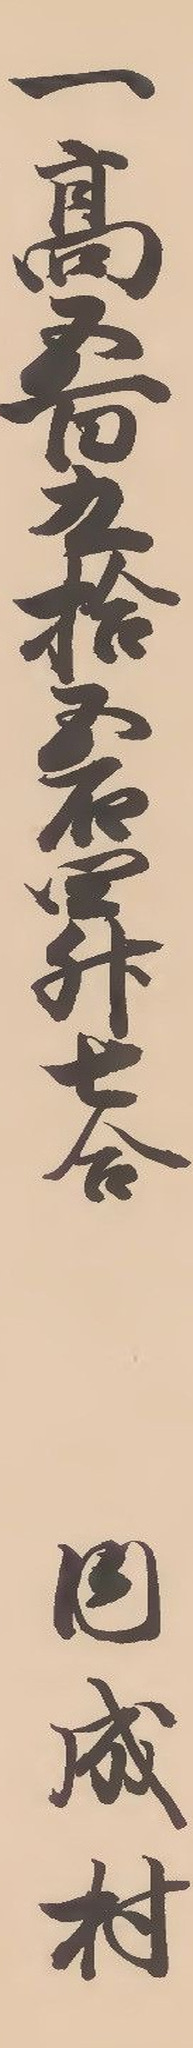一高五百九拾五石四升七合内成村
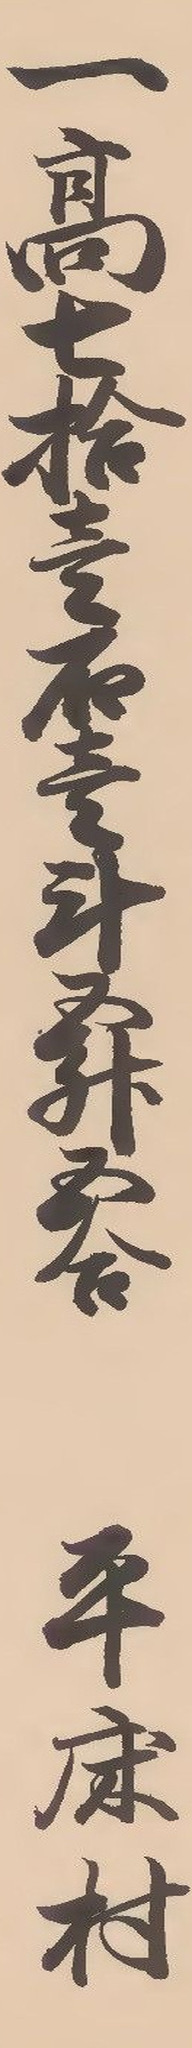一高七拾壱石壱斗五升五合平床村

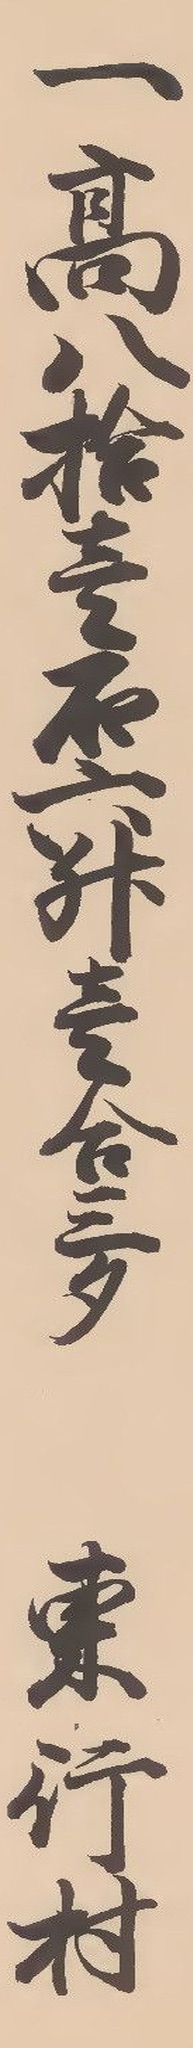一高八拾壱石六升壱合三勺東行村
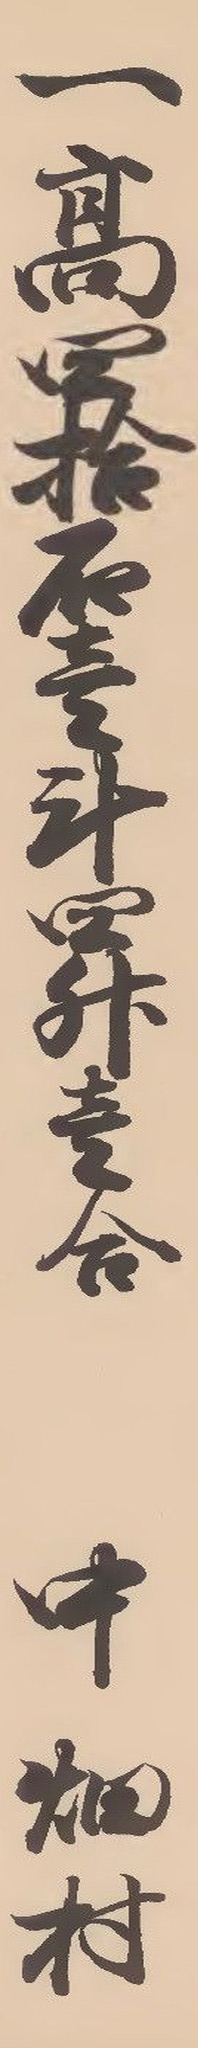一高四拾石壱斗四升壱合中畑村
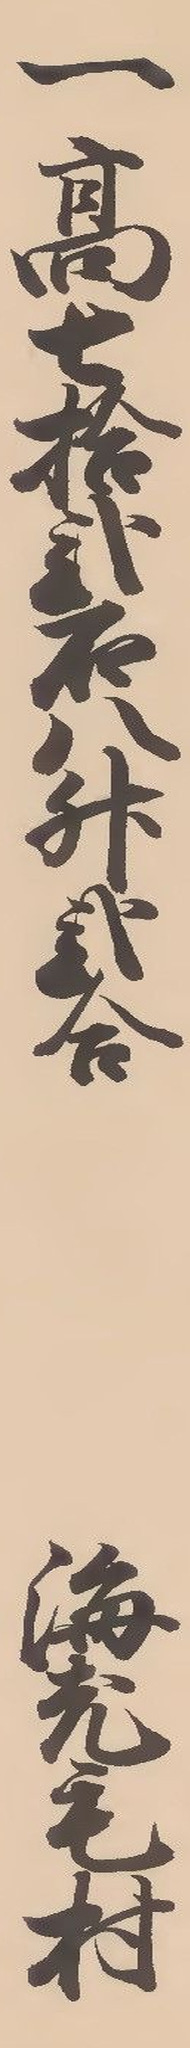一高七拾弐石八升弐合海老毛村
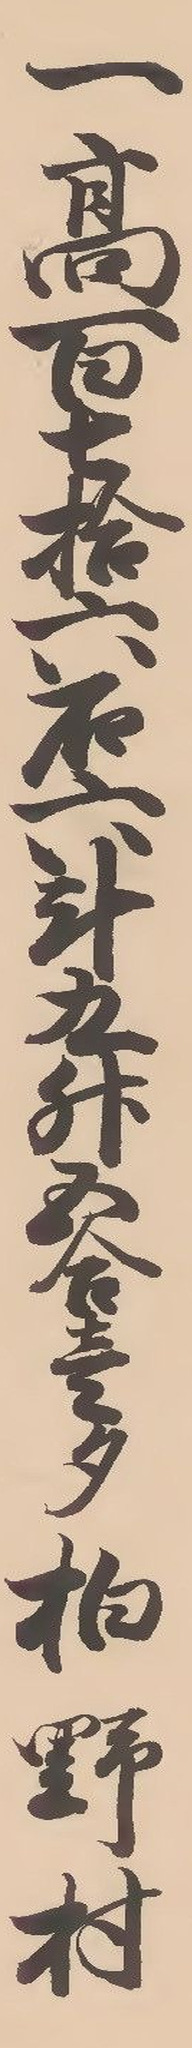一高百七拾六石六斗九升五合壱勺柏野村
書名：豊後国郷帳
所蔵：国立公文書館 National Archives of Japan
